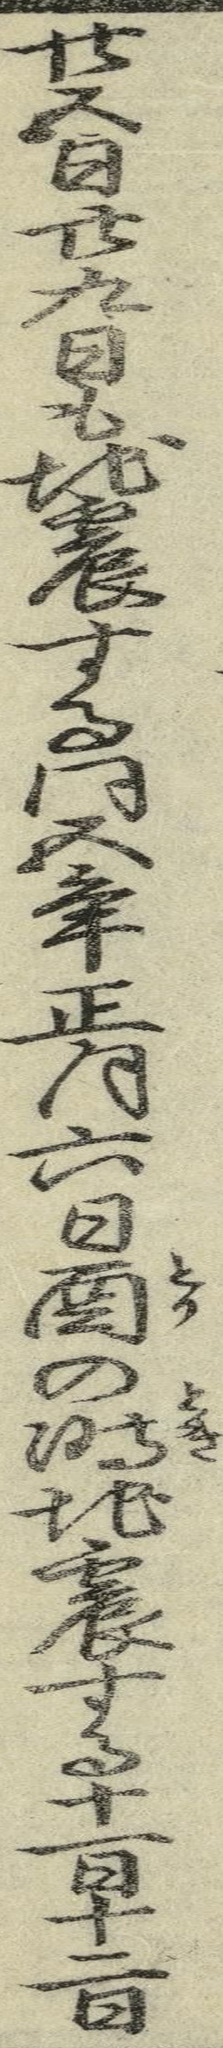廿五日廿九日も地震する同五年正月六日酉の時地震する十一日十二日
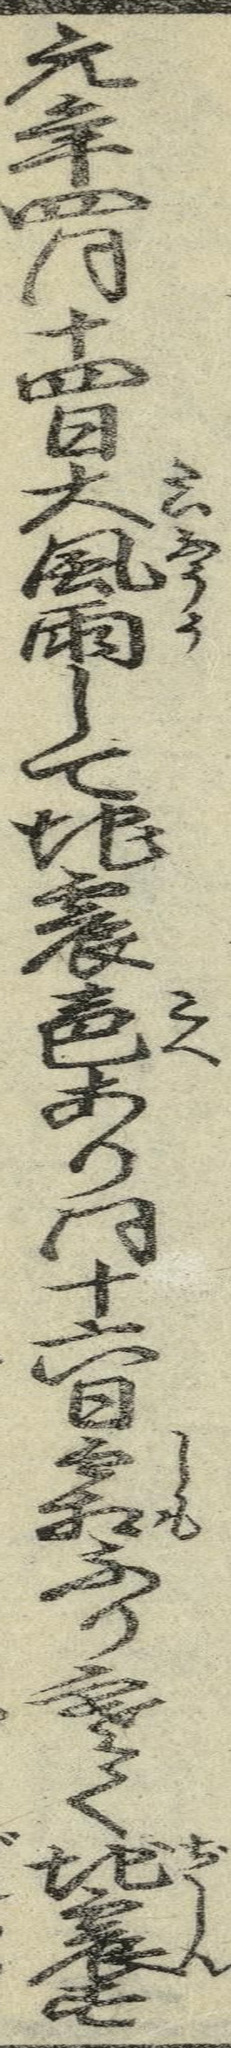元年四月十四日大風雨して地震声あり同十六日霜ふり曇て地震す
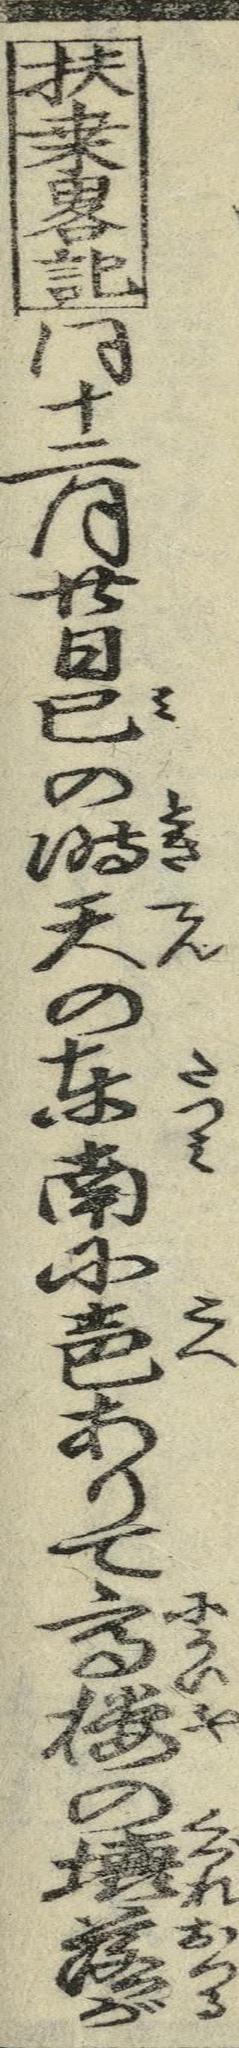扶桑略記同十二月廿日巳の時天の東南に声ありて高楼の壊落が
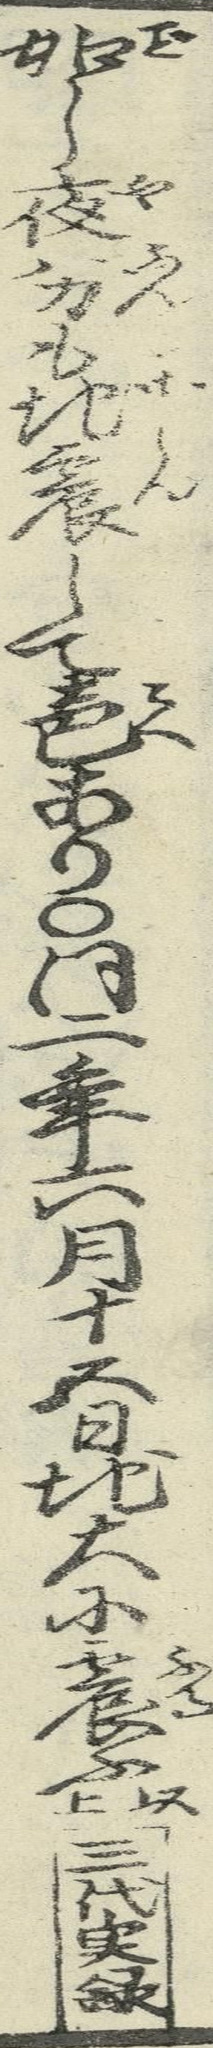如し夜分も地震して声あり〇同二年六月十五日地大に震ふ以上三代実録
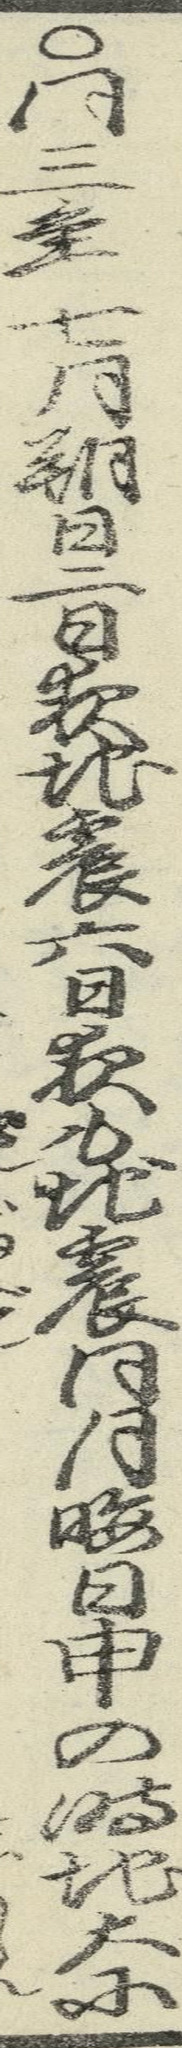〇同三年七月朔日二日夜地震六日夜も地震同月晦日申の時地大に
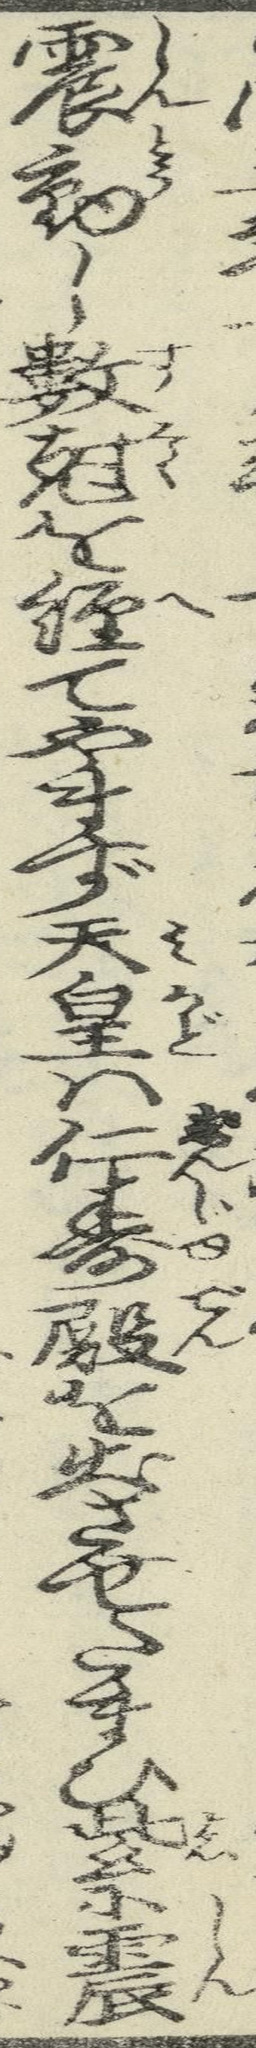震動し数尅を経てやまず天皇は仁寿殿を出させたまひ紫宸
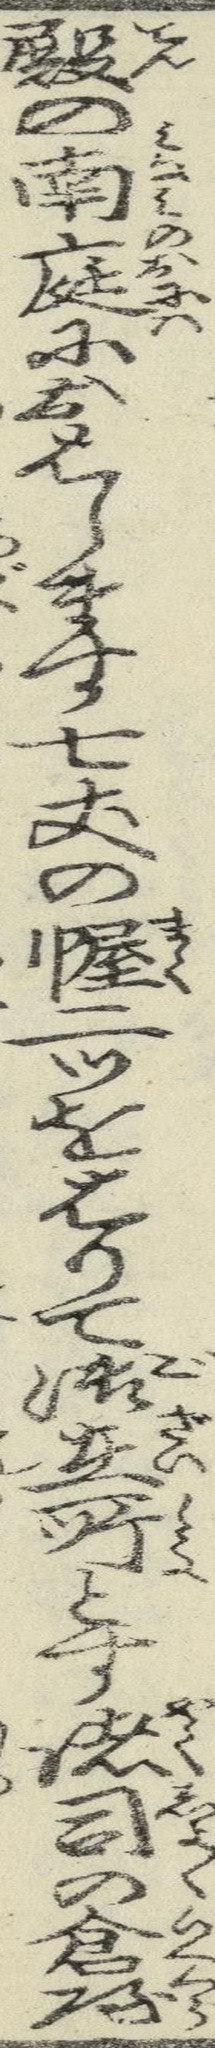殿の南庭におはします七丈の幄二つをはりて御在所とす諸司の倉屋
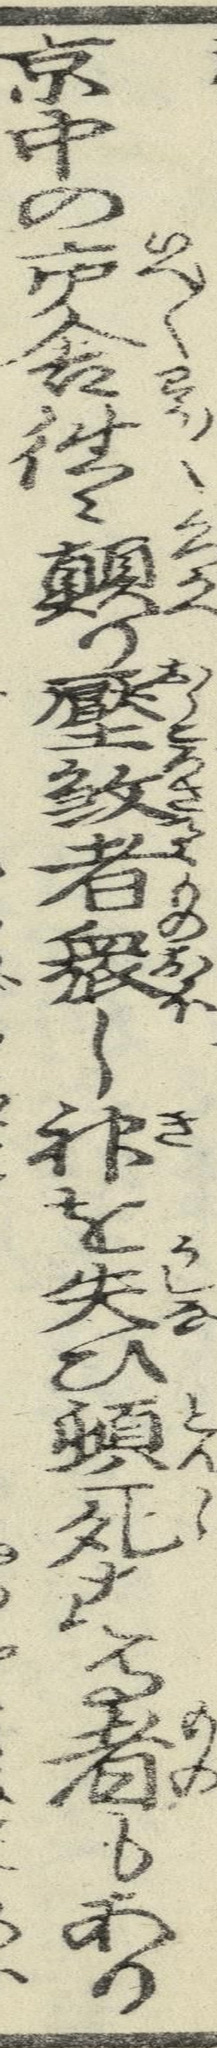京中の廬舎往々顛り圧煞者衆し神を失ひ頓死する者もあり
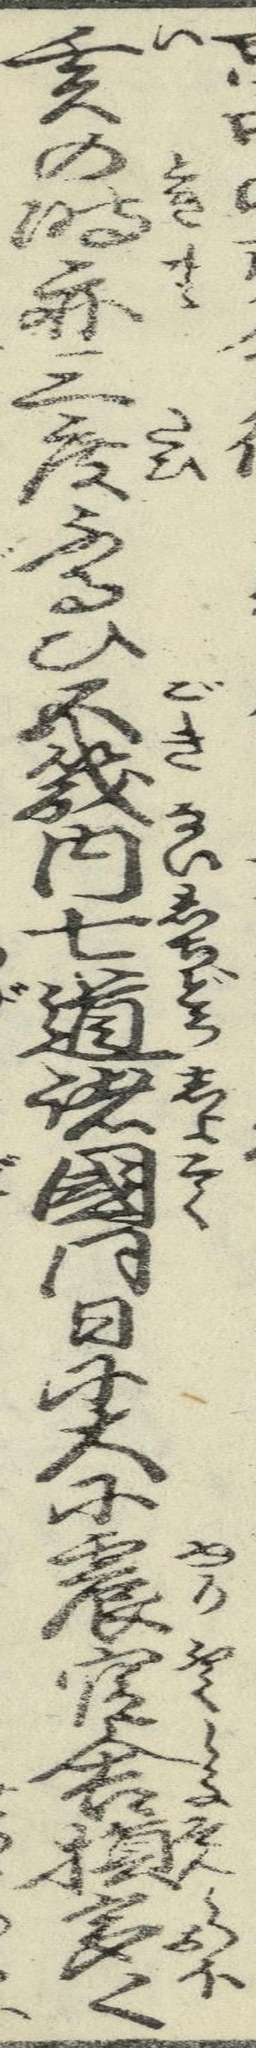亥の時亦三度ふるひ五畿内七道諸国同日に大に震宦舎損多く
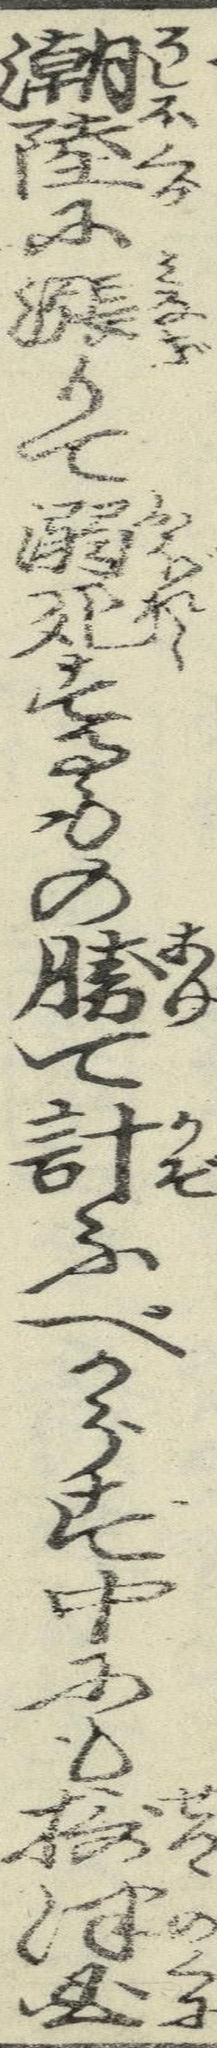潮陸に漲りて溺死するもの勝て計ふべからす中にも摂津国
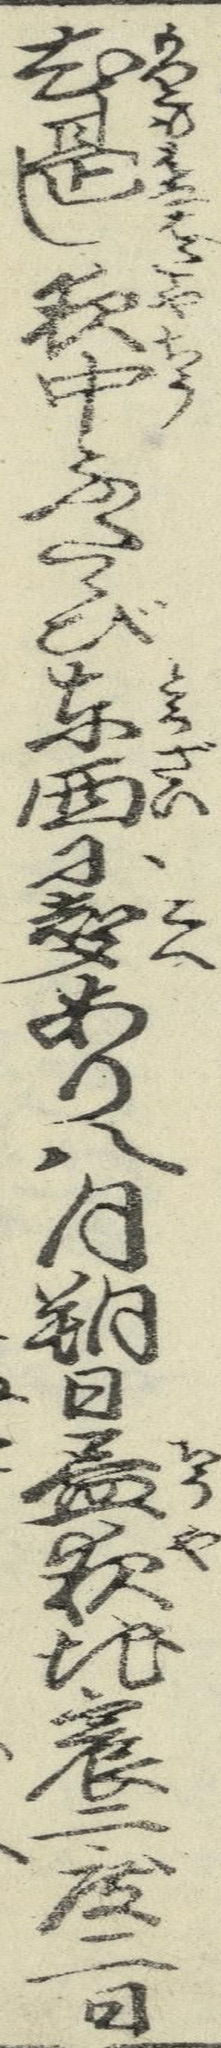尤甚し夜中ふたヽび東西に声あり八月朔日昼夜地震二度二日
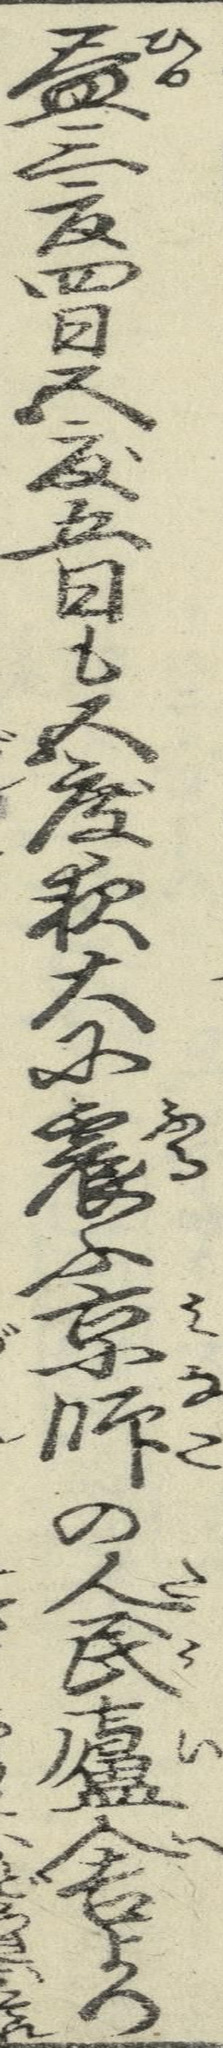昼三度四日五度五日も五度夜大に震ふ京師の人民廬舎より
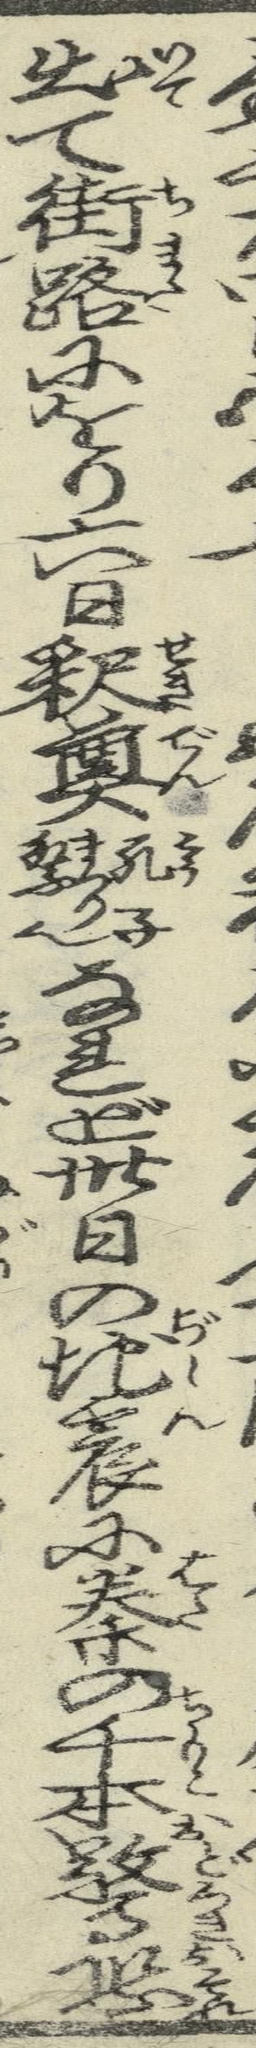出て街路にをり六日釈奠孔子祭也なれど卅日の地震に秦の千本驚恐
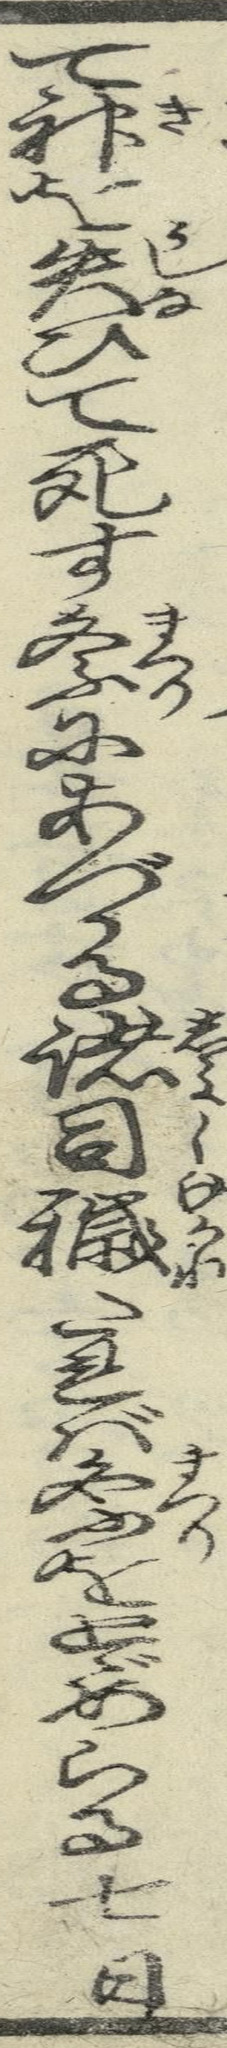て神を失ひて死す祭にあづかる諸司穢たれば祭をとゞめらる七日

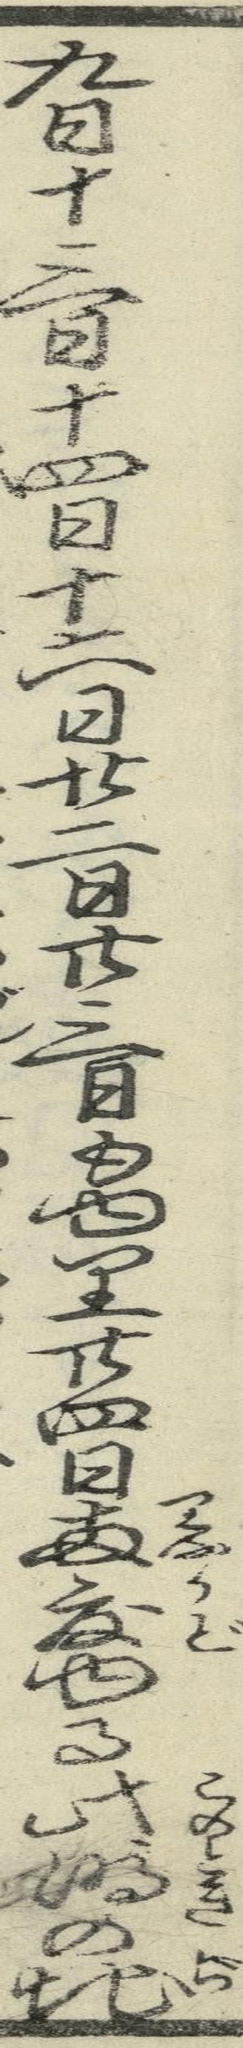九日十三日十四日十六日廿二日廿三日もゆり廿四日両度ゆる此時の地
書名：地震年代記
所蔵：東京大学地震研究所図書室 Earthquake Research Institute Library, The University of Tokyo, JAPAN
